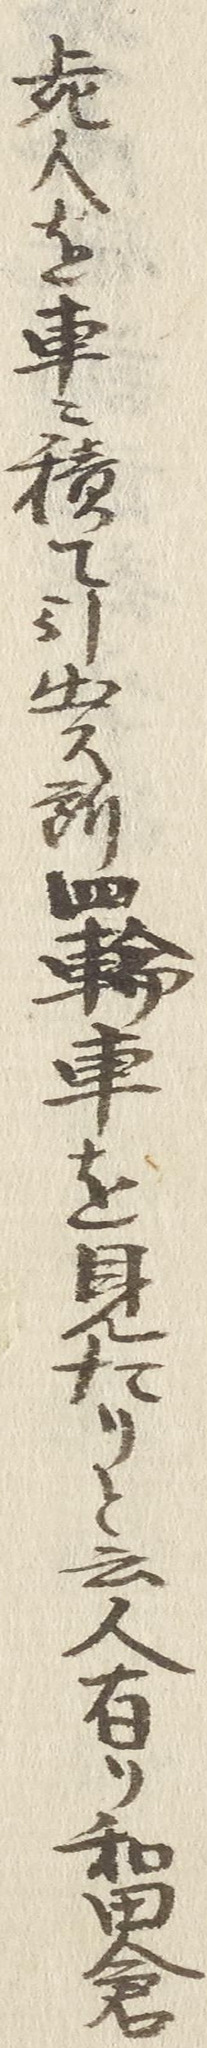死人を車二積て引出ス所四輪車を見たりと云人有和田倉
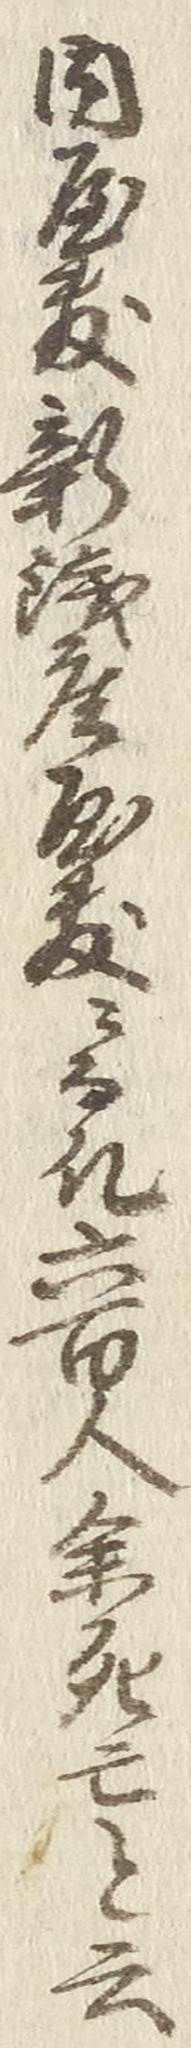内屋敷新鮮浅座屋敷二而凡六百人余死亡と云
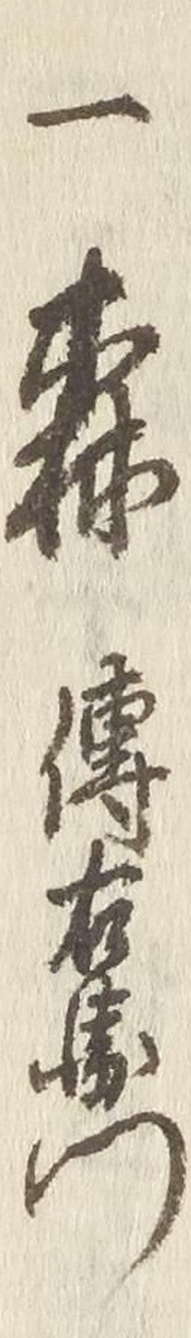一森伝右衛門
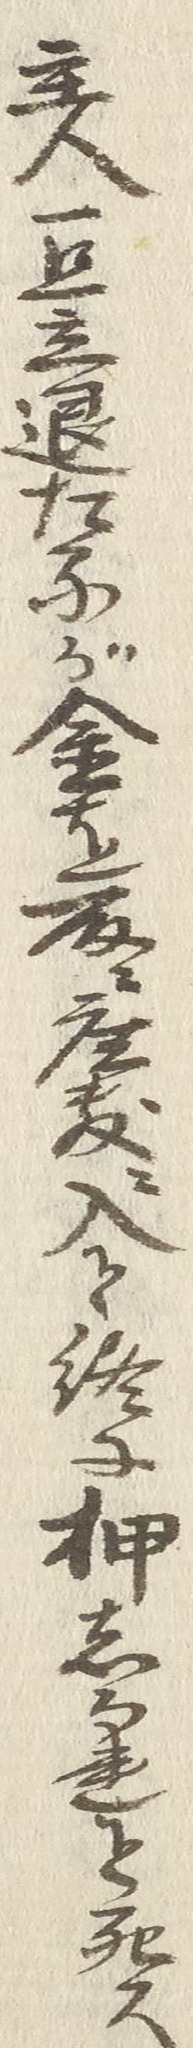主人一旦立退たるが金を取二屋敷二入て終に押しかれて死ス
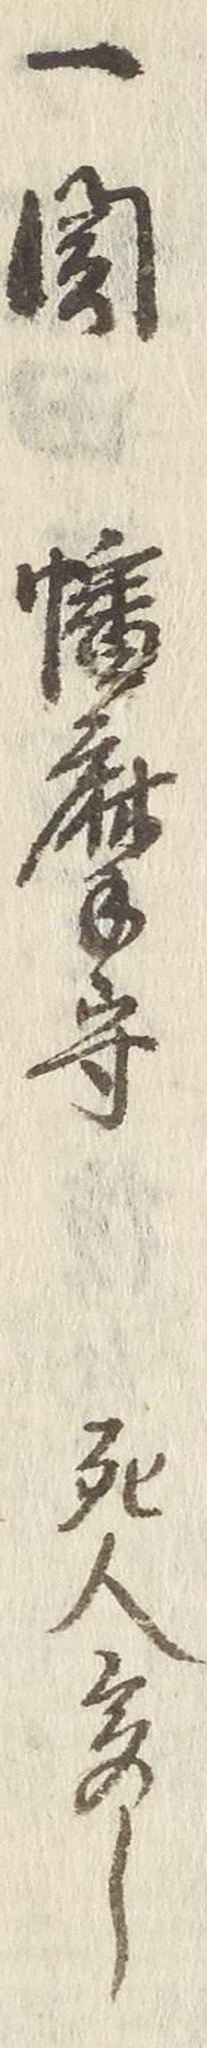一関播磨守死人多し
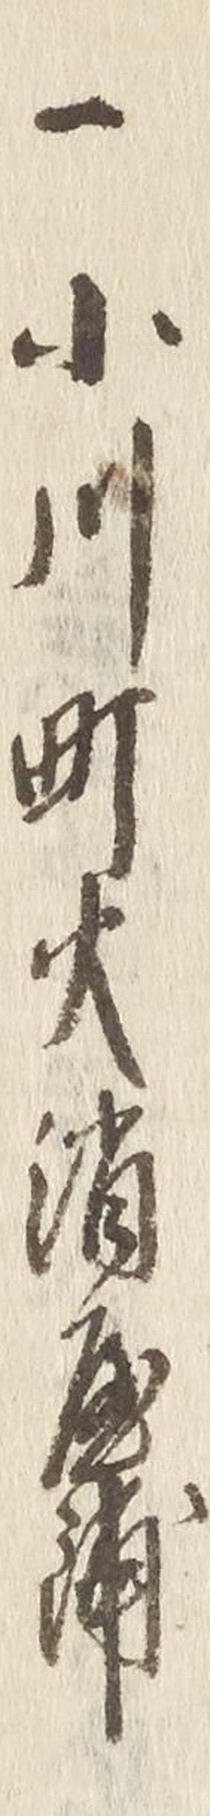一小川町火消屋鋪
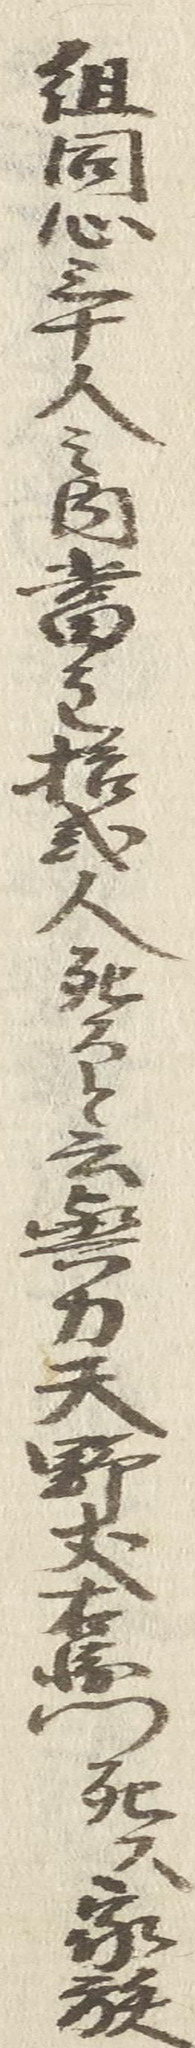組同心三十人之内当主拾弐人死すと云与力天野丈右衛門死ス家族
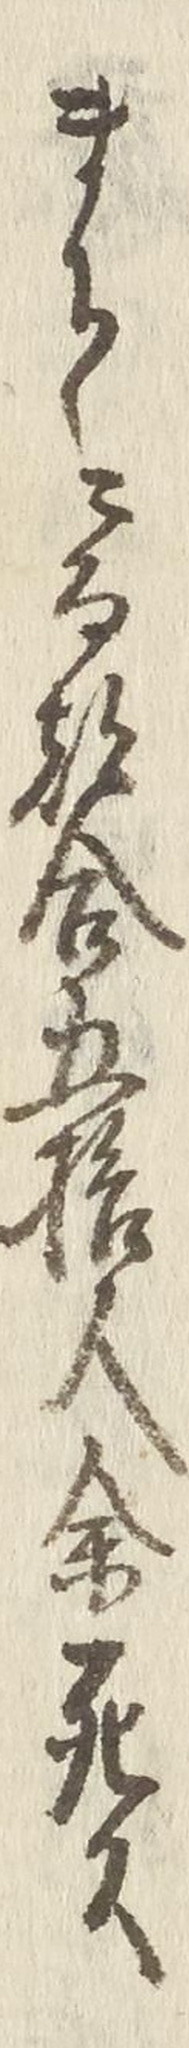まて二而都合五拾人余死ス

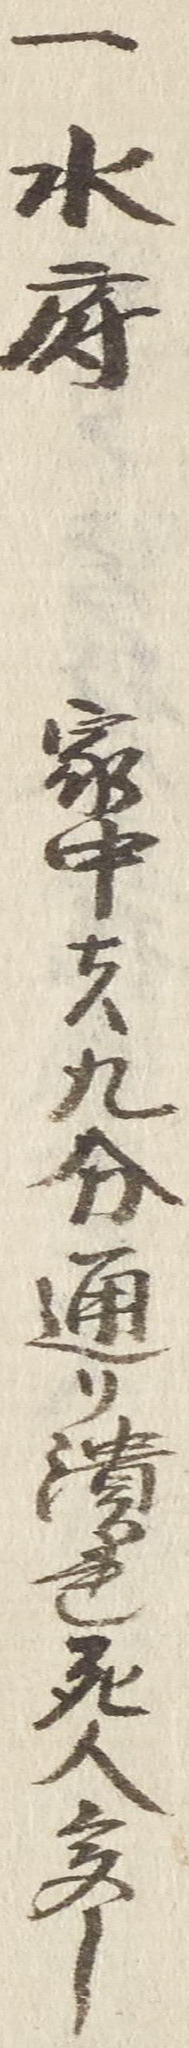一水府家中は九分通り潰れ死人多し
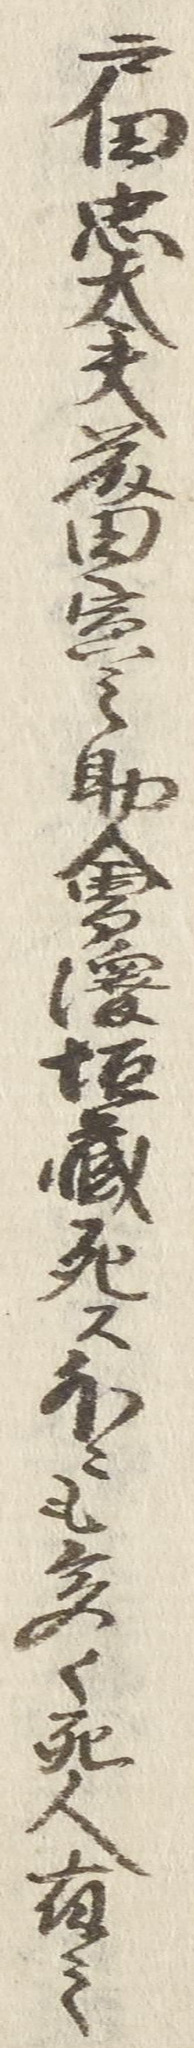戸田忠太夫藤田寅之助会沢垣蔵死ス外ニも多く死人有之
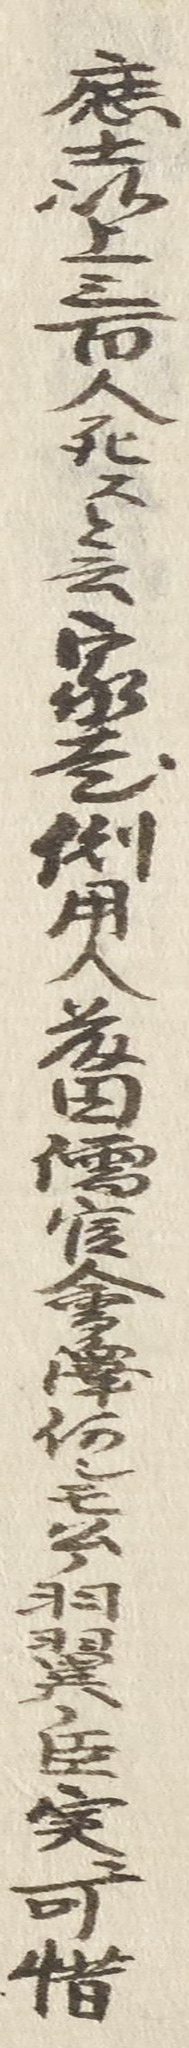庶士以上三百人死スと云家老側用人藤田儒官会沢何レモ公ノ羽翼ノ臣実ニ可惜
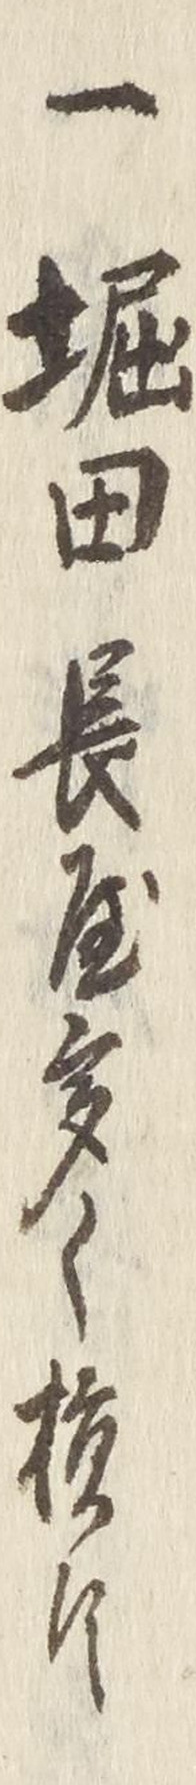一堀田長屋多く損す
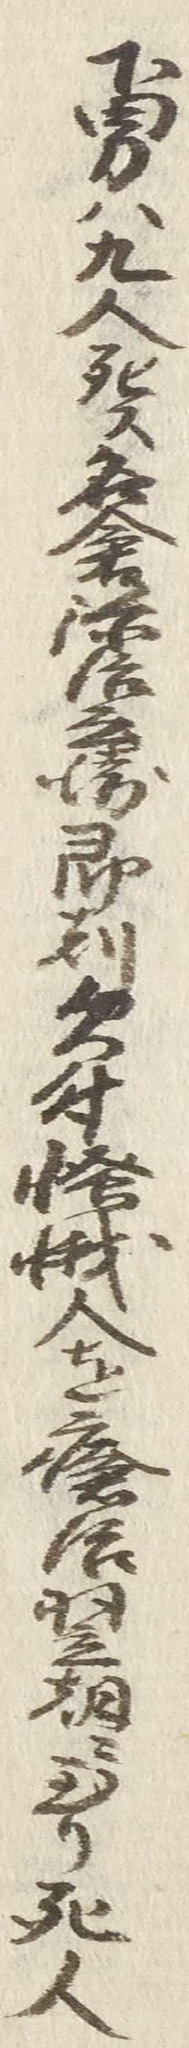下男は九人死ス名倉弥治兵衛即刻欠付怪我人を療治翌朝ニ至り死人
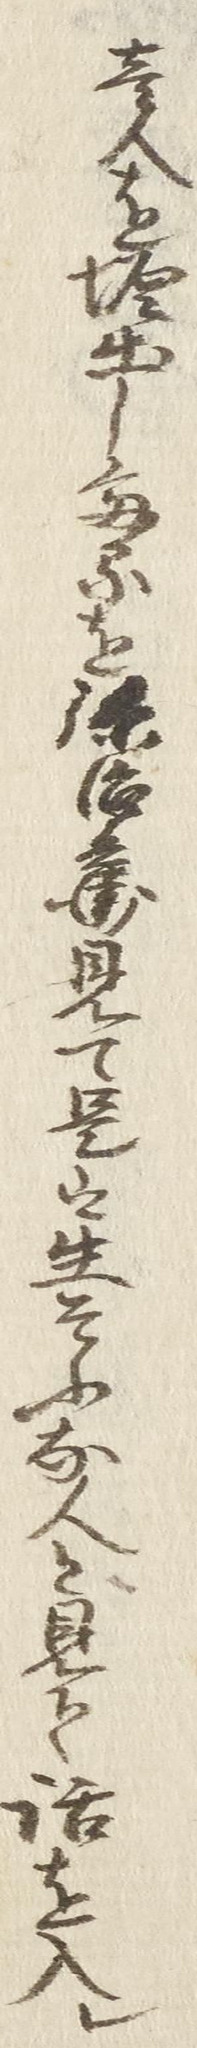壱人を掘出したるを弥治兵衛見て是は生そふなんとを入レ
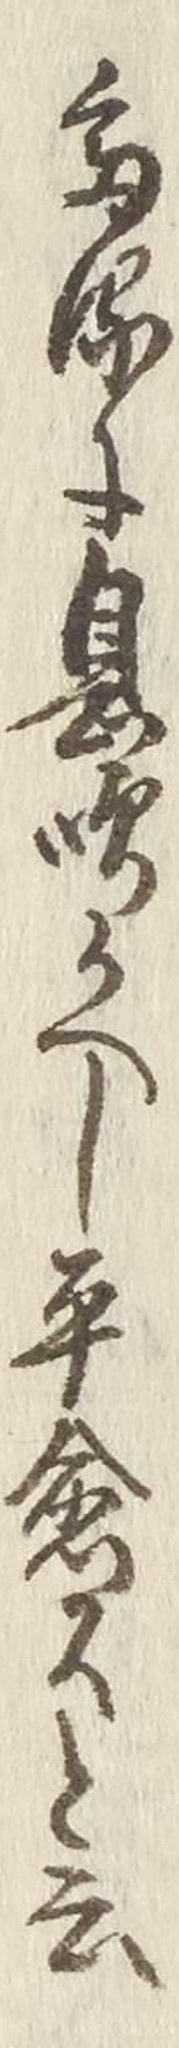たるに息吹かへし平愈スと云
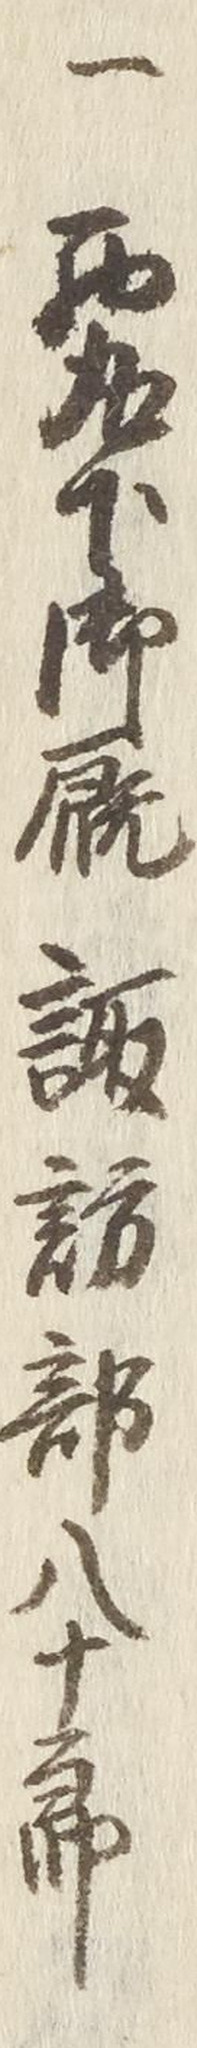一西丸下御厩諏訪部八十郎
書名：従往古地震御届書記誌之一
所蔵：東京大学地震研究所図書室 Earthquake Research Institute Library, The University of Tokyo, JAPAN
